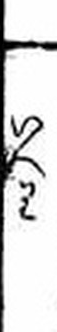いへり
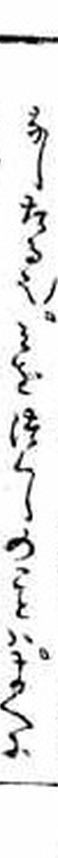なしたる也みをつくしのことはまへに当
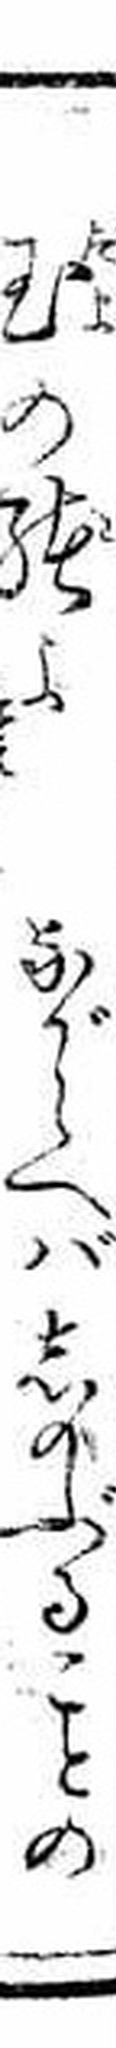玉の緒よながらへばしのぶることの
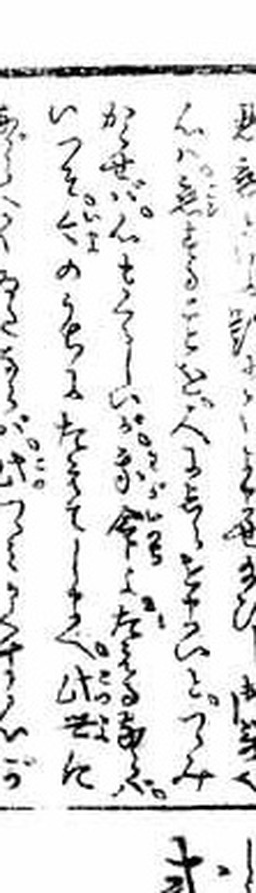かくせば心もくるしいが我命よたえるならば
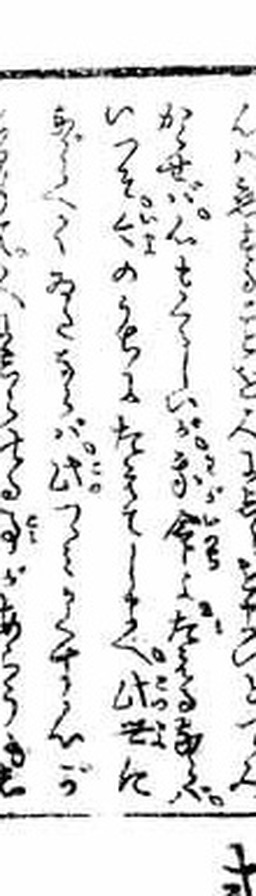いつそ今のうちにたえてしまへ此世に
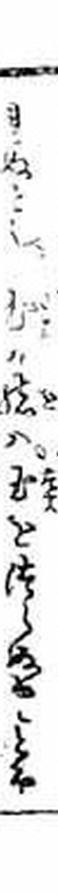れぬと也玉の緒は玉をつらぬることを
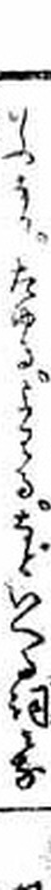いふなりたゆるよわるなどいへる詞みな
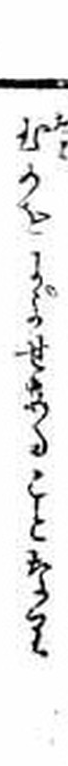玉のをによせあることなり

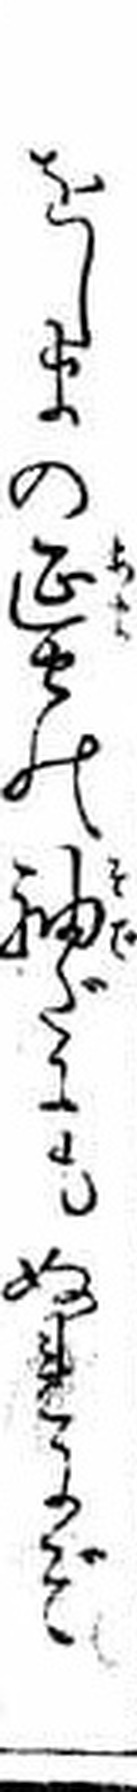をしまの塰の袖だにもぬれにぞ
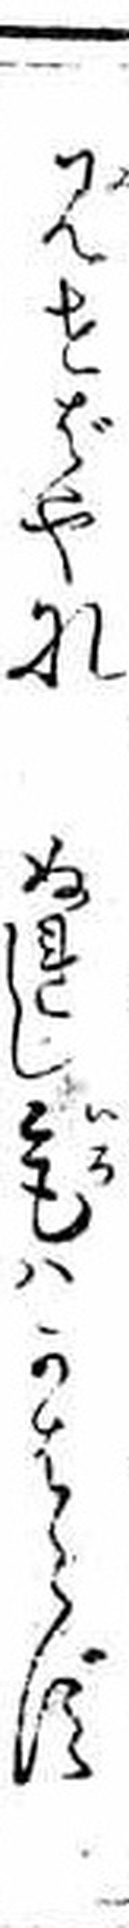見せばやなぬれし色はかはらず
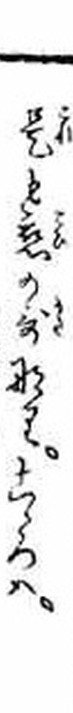是も恋の哥なりこゝろは
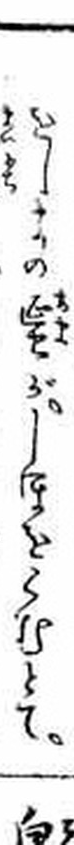をしまの塰がしほをくむとて殷富
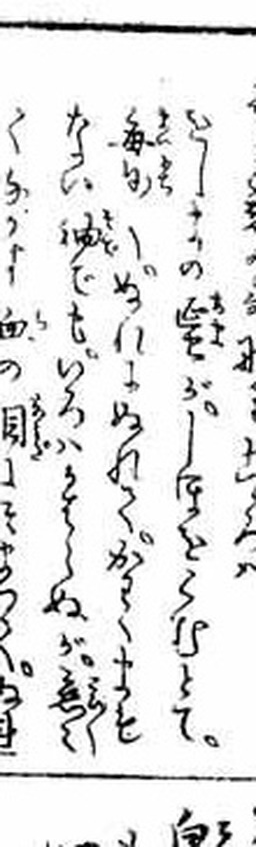毎日〳〵ぬれにぬれてかわくまも
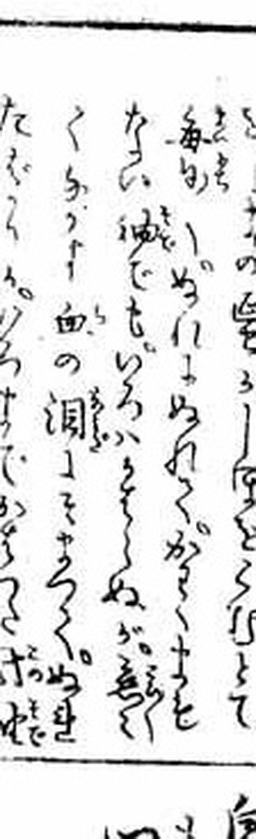ない袖でもいろはかはらぬが恋々門院
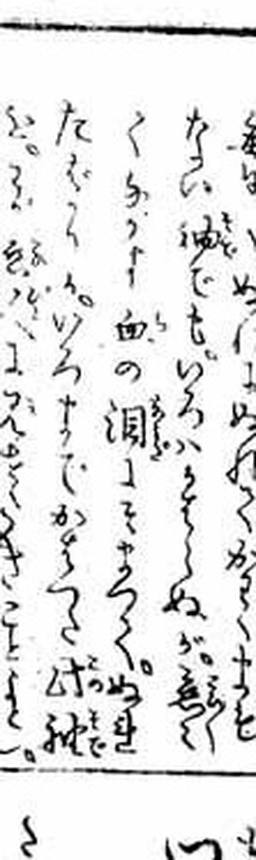てながす血の泪にそまつてぬれ
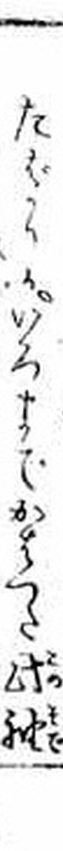たばかりかいろまでかはつた此袖
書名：小倉百人一首
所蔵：東京学芸大学教育コンテンツアーカイブ
